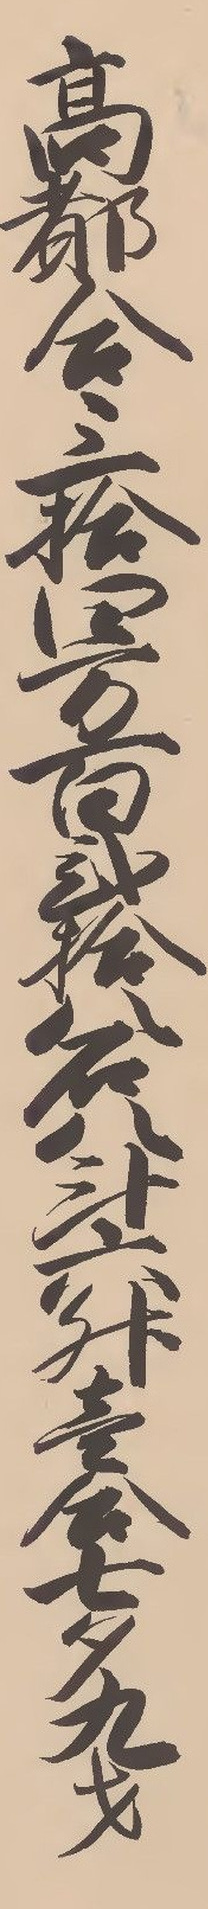高都合三拾四万百弐拾八石八斗六升壱合七勺九才
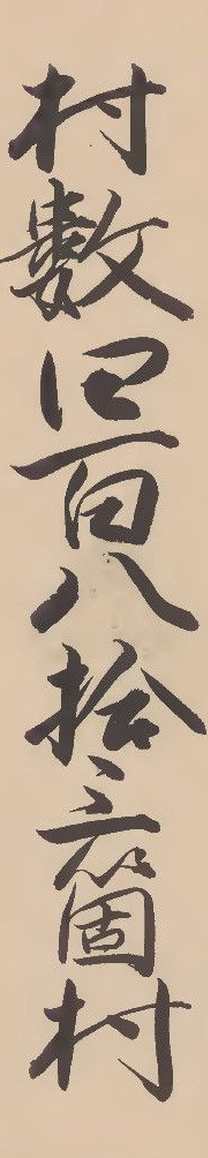村数四百八拾三箇村

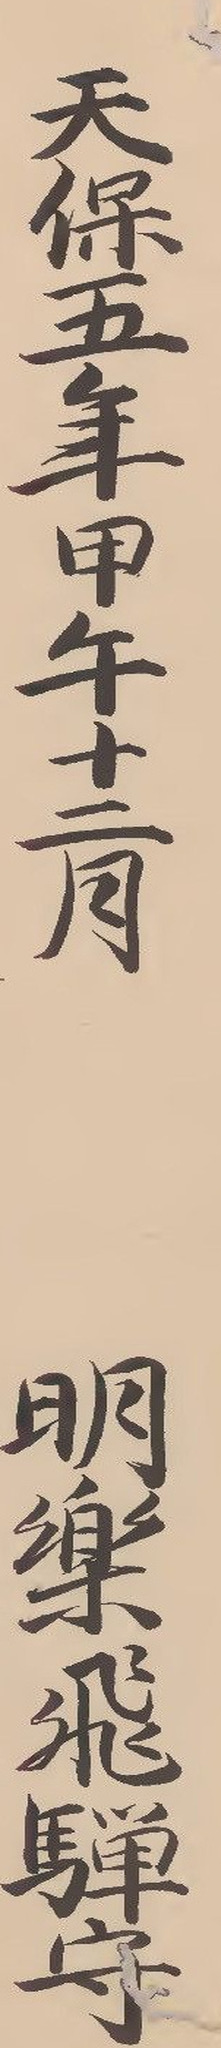天保五年甲午十二月明楽飛騨守
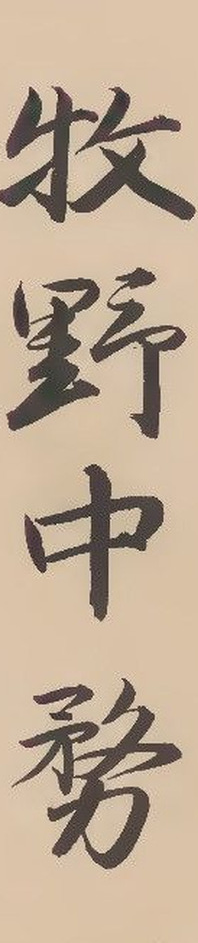牧野中務
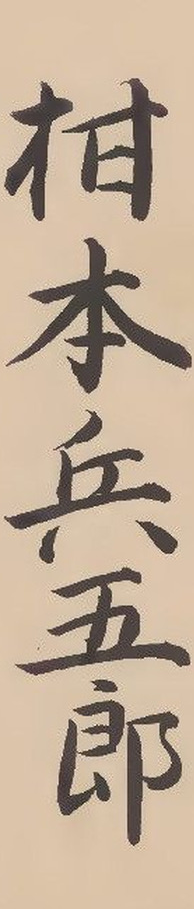柑本兵五郎
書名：日向国郷帳
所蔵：国立公文書館 National Archives of Japan
